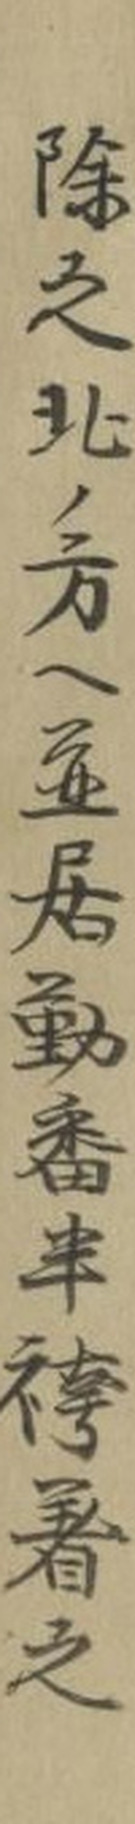除之北ノ方へ並居勤番半袴着之

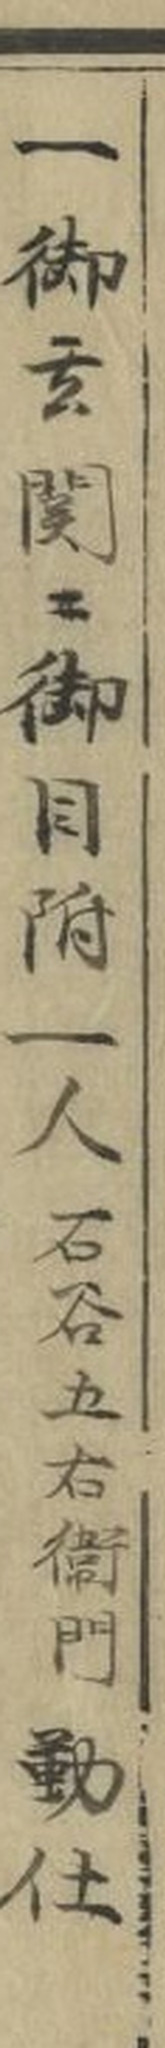一御玄関ニ御目附一人石谷五右衛門勤仕
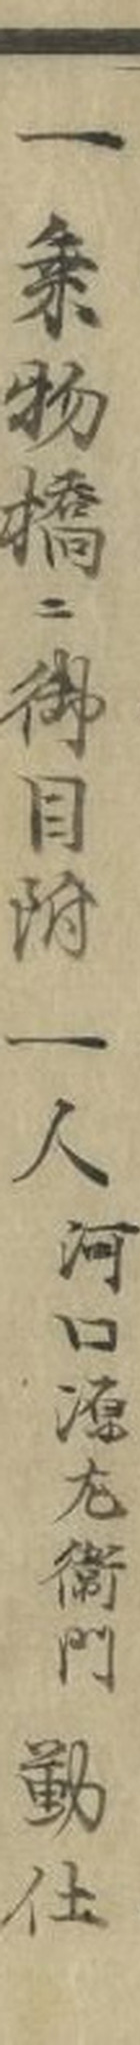一乗物橋ニ御目附一人河口源左衛門勤仕
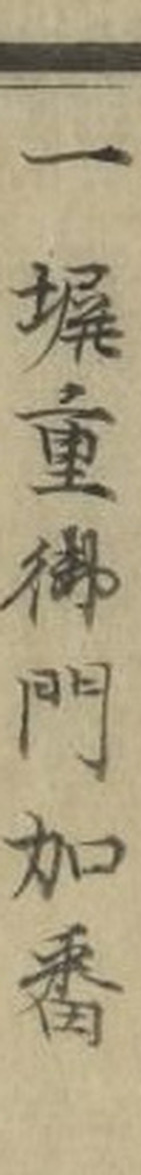一堀重御門加番
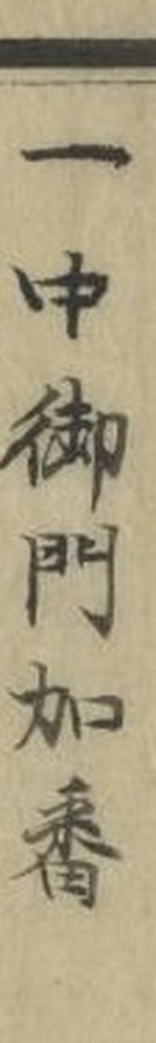一中御門加番
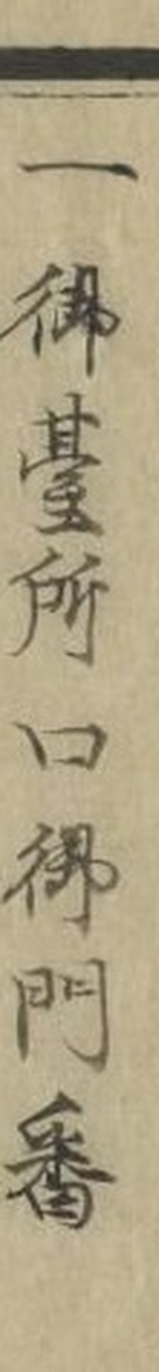一御台所口御門番
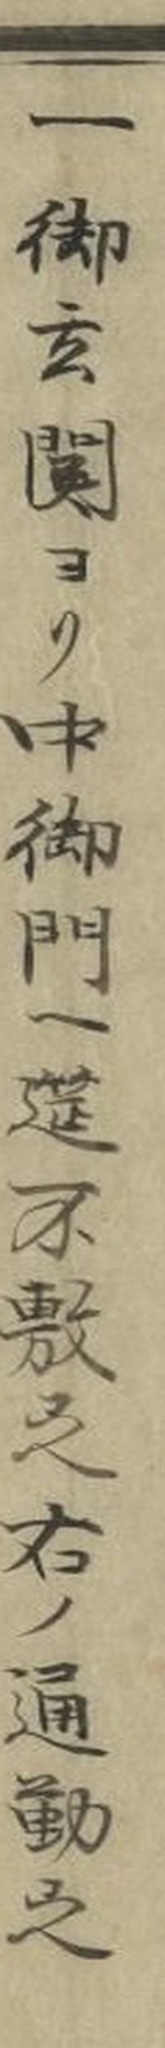一御玄関ヨリ中御門へ筵不敷之右ノ通勤之
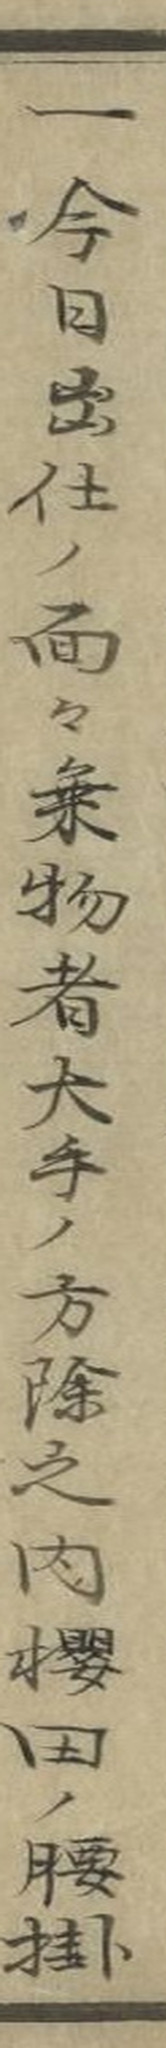一今日出仕之面々乗物は大手ノ方除之内桜田のノ腰掛
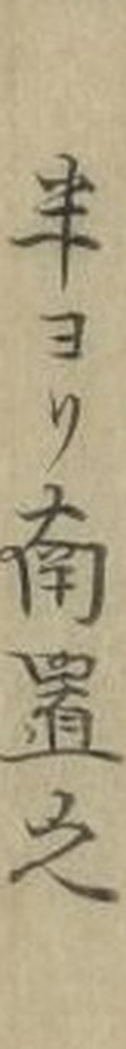半ヨリ南置之
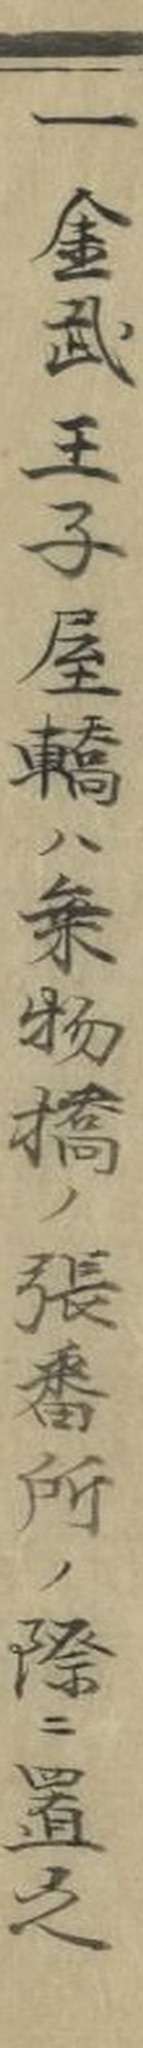一金武王子屋轎ハ乗物橋ノ張番所ノ際二置之
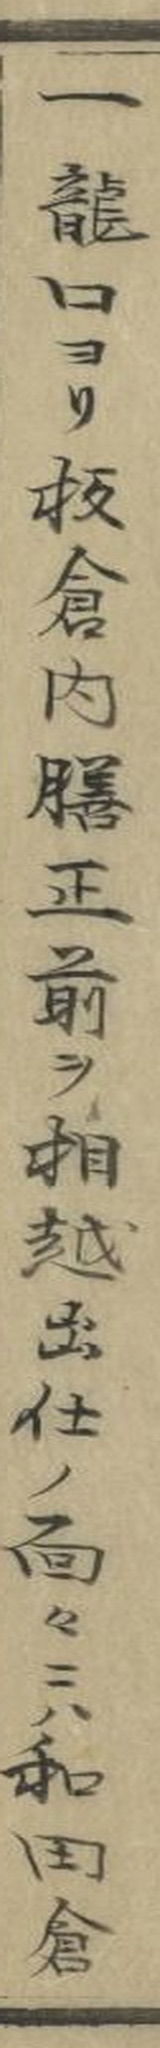一龍口ヨリ板倉内膳正前ヲ相越出仕ノ面々二ハ和田倉
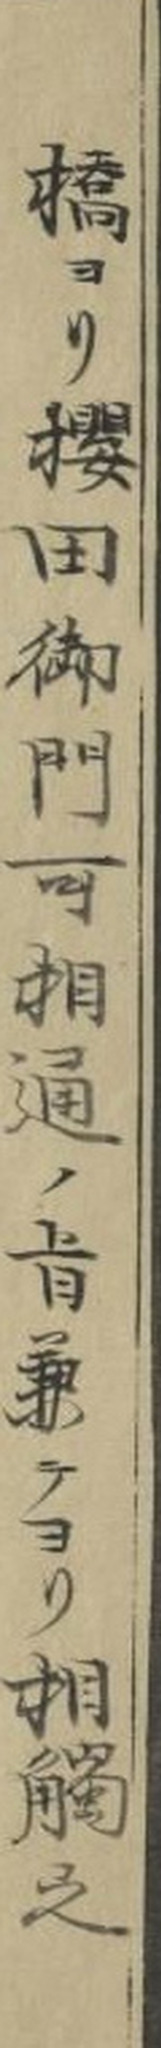橋ヨリ桜田御門可相通ノ旨兼テヨリ相触之
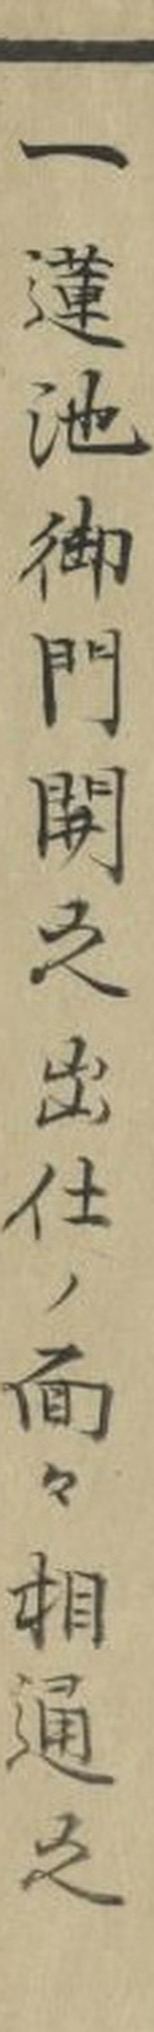一蓮池御門開之出仕ノ面々相通之
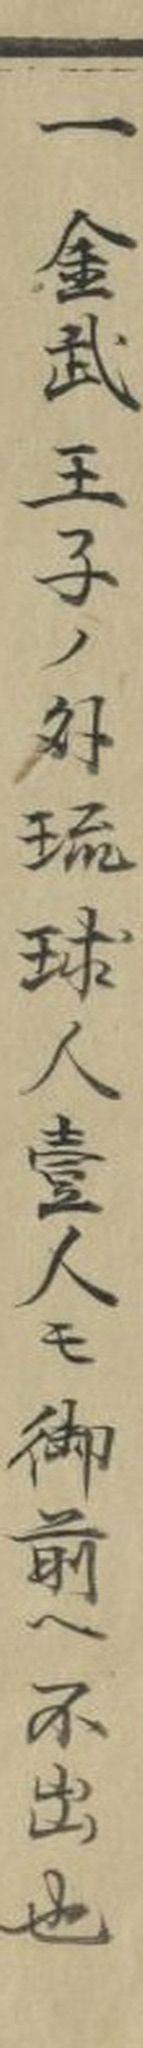一金武王子ノ外琉球人壱人モ御前へ不出也
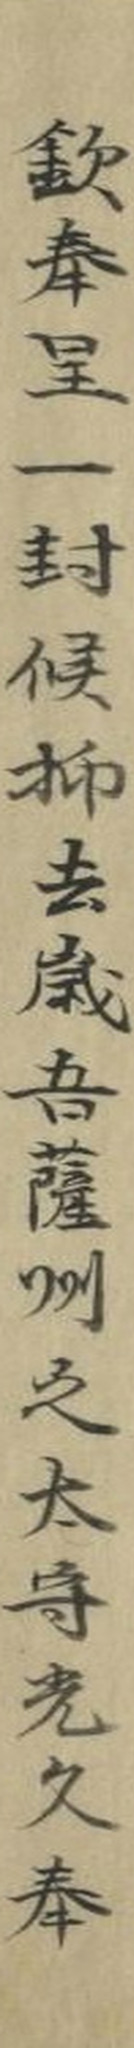欽奉呈一封候抑去歳吾薩州之太守光久奉
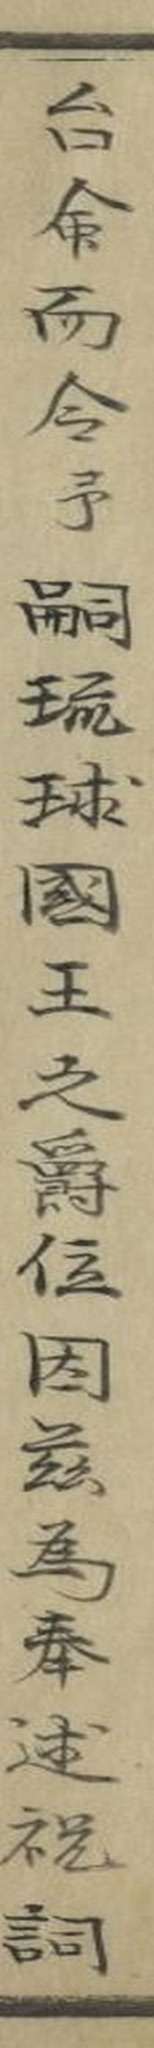台命而令予嗣琉球国王之爵位因茲為奉述祝詞
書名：琉球往来（下）
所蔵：University of the Ryukyus Library
